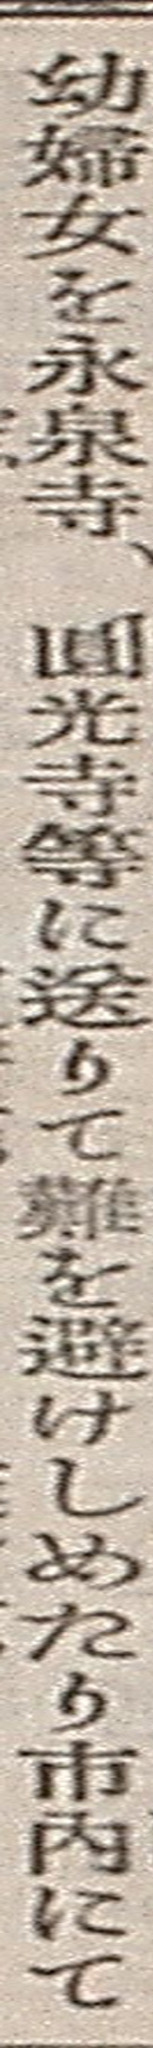幼婦女を永泉寺、円光寺等に送りて難を避けしめたり市内にて
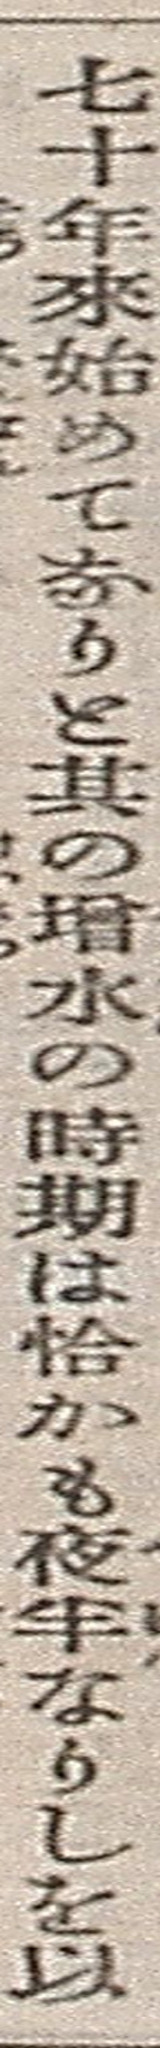七十年來始めてなりと其の増水の時期は恰かも夜半なりしを以
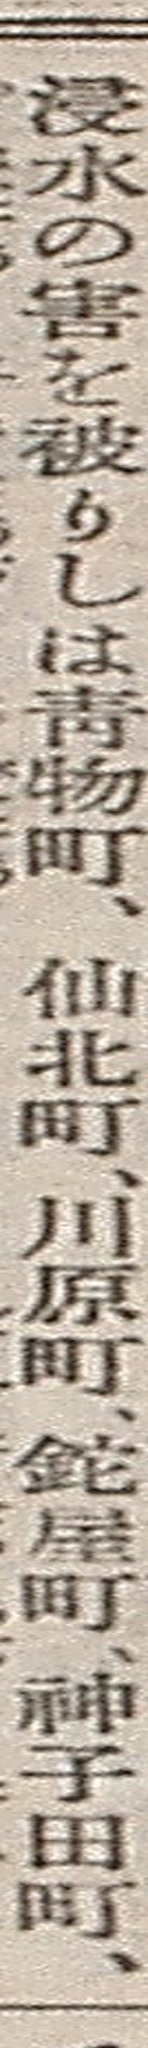浸水の害を被りしは青物町、仙北町、川原町、鉈屋町、神子田町、
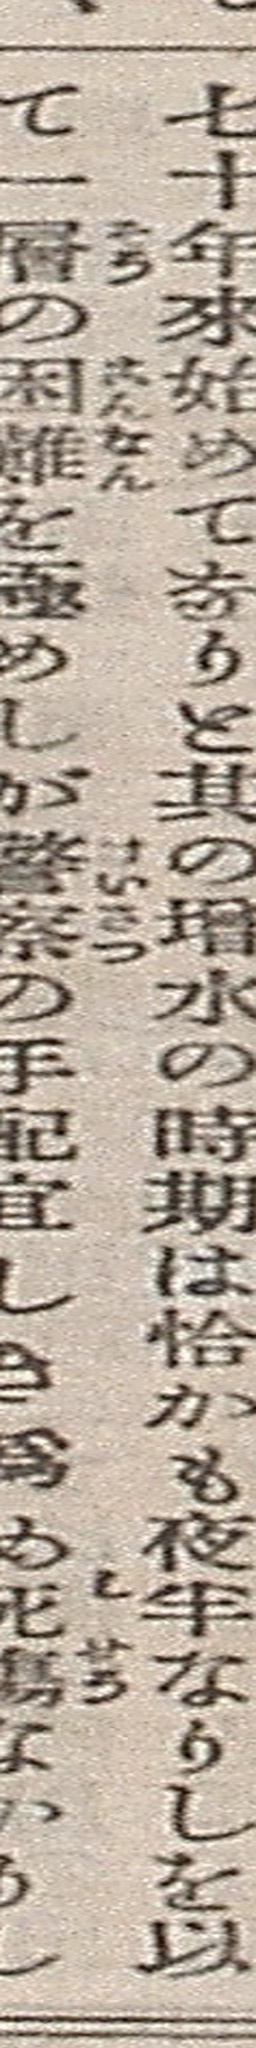て一層の困難を極めしが警察の手配の宜しき為め死傷なかりし
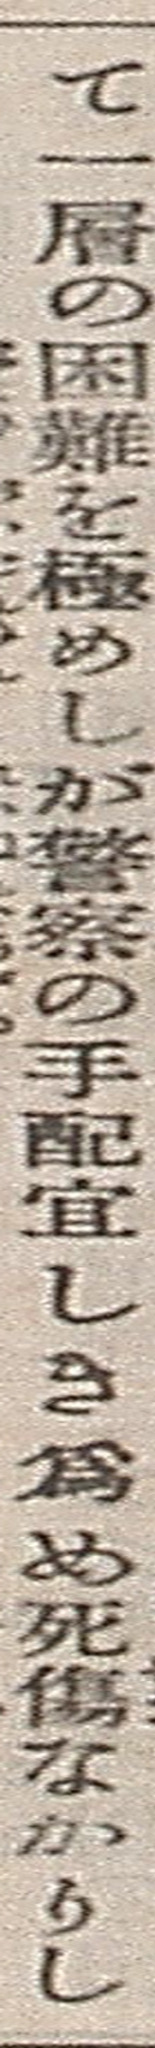て一層の困難を極めしが警察の手配の宜しき為め死傷なかりし
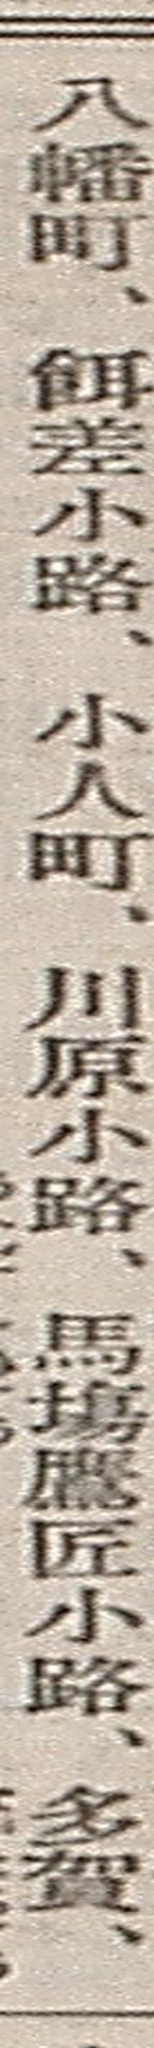八幡町、餌差小路、小人町、川原小路、馬場鷹匠小路、多賀、
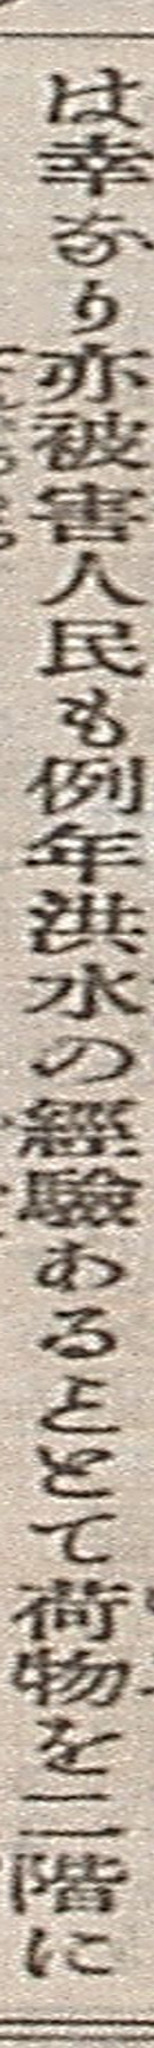は幸なり亦被害人民も例年洪水の経験あることとて荷物を二階に
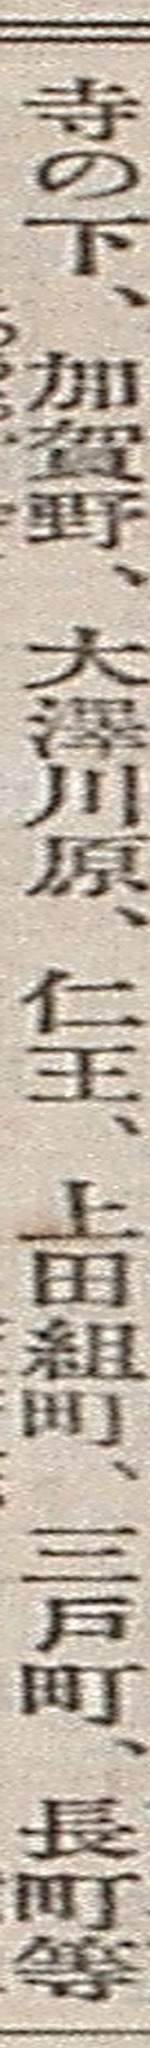寺の下、加賀野、大沢川原、仁王、上田組町、三戸町、長町等
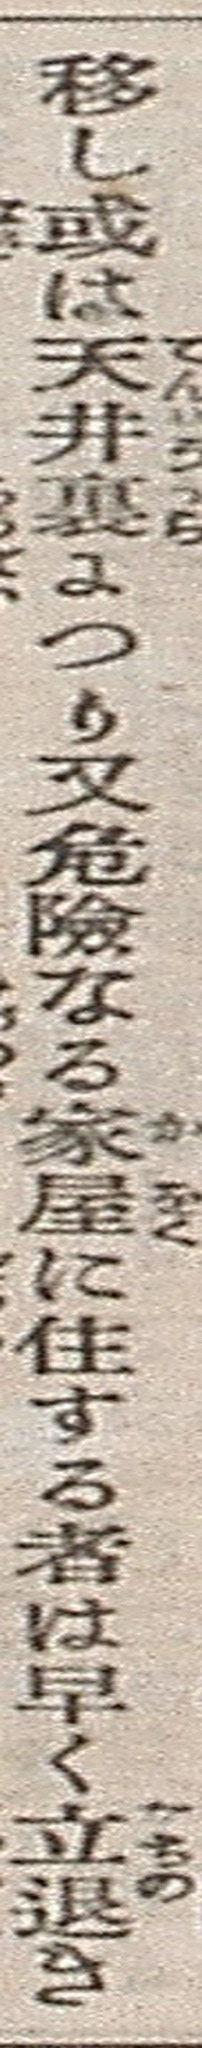移し或は天井裏につり又危険なる家屋に住する者は早く立退き
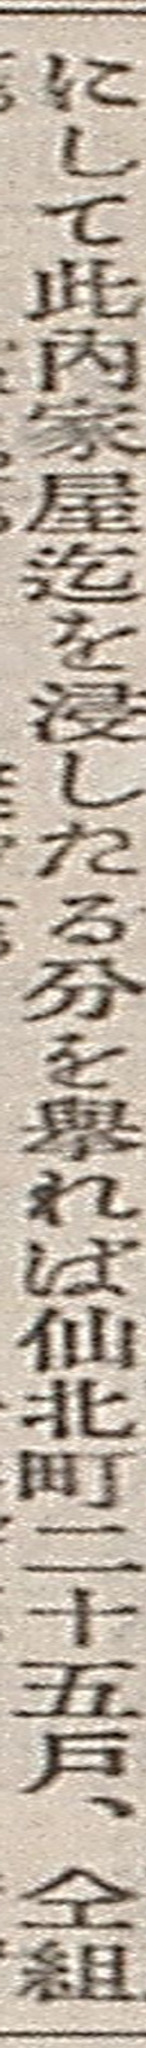にして此内家屋迄を浸したる分を挙れば仙北町二十五戸、同組
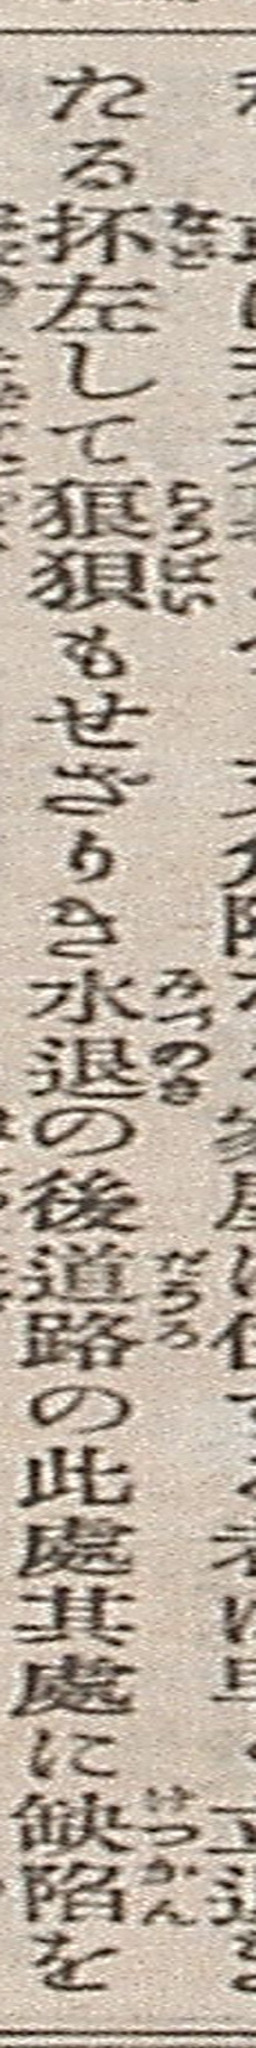たる抔左して狼狽みせざりき水退の後道路の此処其処に缺陥を
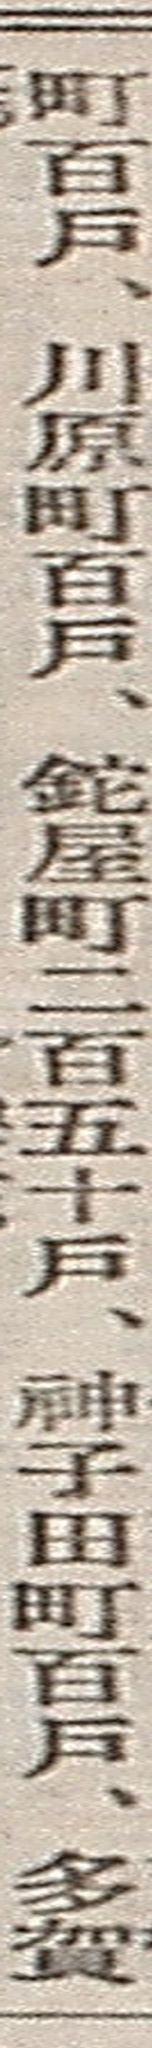町百戸、川原町百戸、鉈屋町二百五十戸、神子田町百戸、多賀
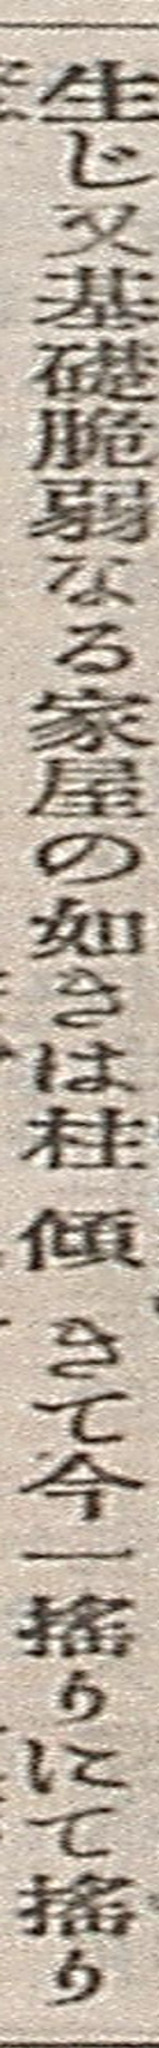生じ又基礎脆弱なる家屋の如きは柱傾きて今一揺りにて揺り
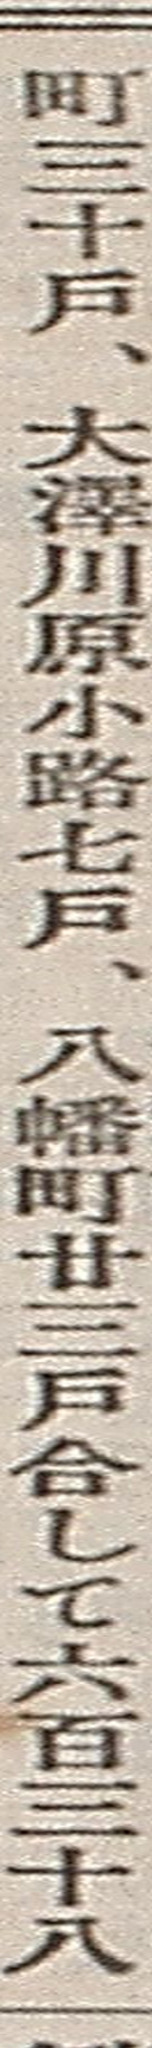町三十戸、大沢川原小路七戸、八幡町廿三戸合して六百三十八
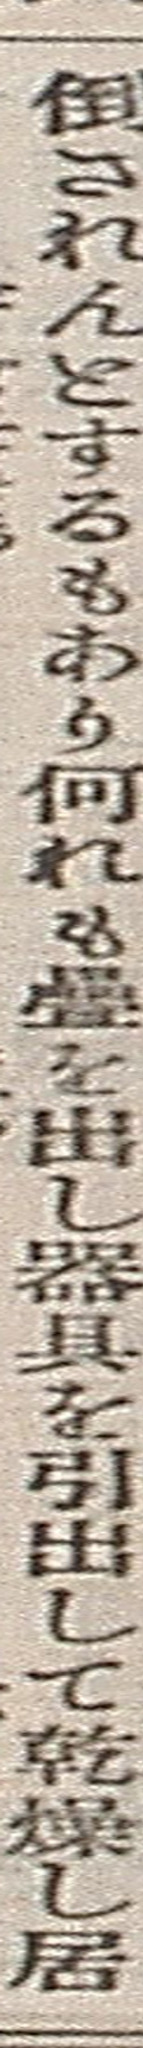倒されんとするもあり何れも畳を出し器具を引出して乾燥し居
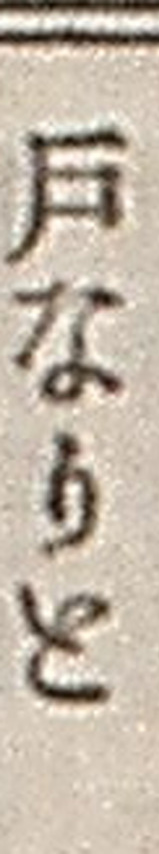戸なりと
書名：風俗畫報臨時増刊第百二十八號　洪水被害録（下）
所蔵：東京大学地震研究所図書室 Earthquake Research Institute Library, The University of Tokyo, JAPAN
